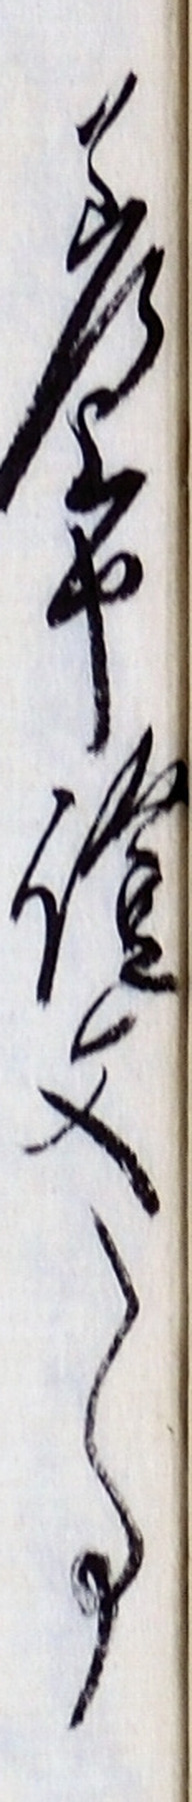差上申証文之事
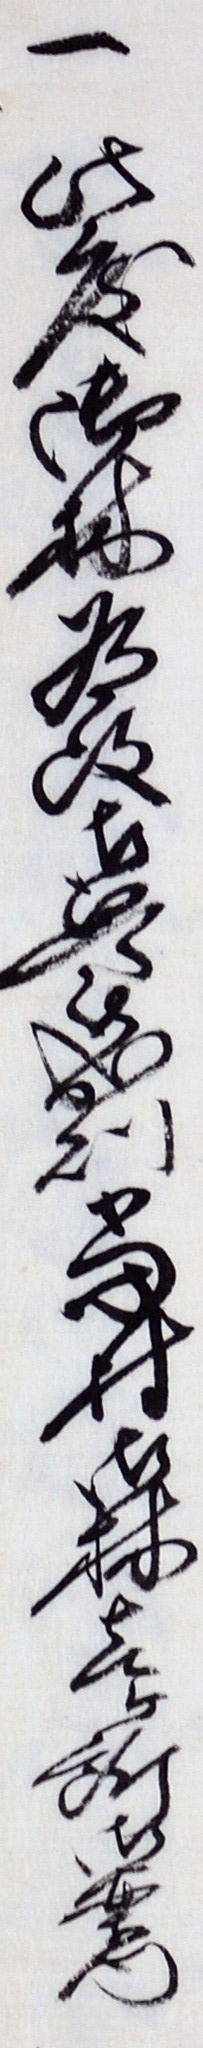一此度御林為改御廻り被成則当村御林壱ヶ所御案内
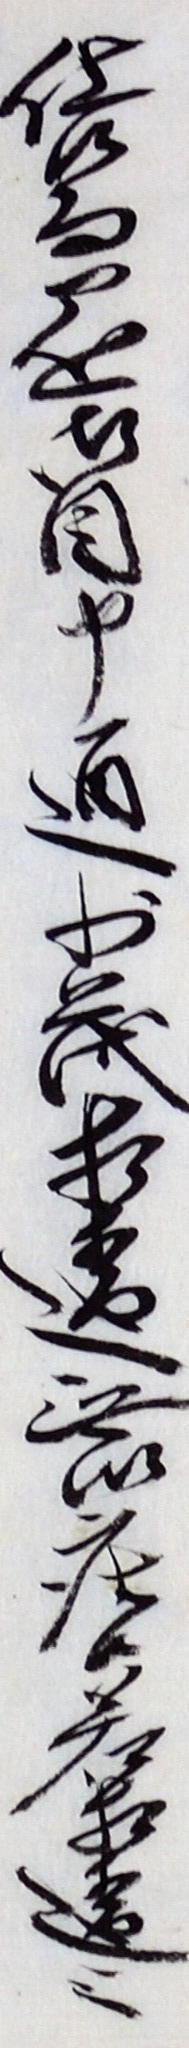仕候而懸御目申通少も相違無御座候若相違之
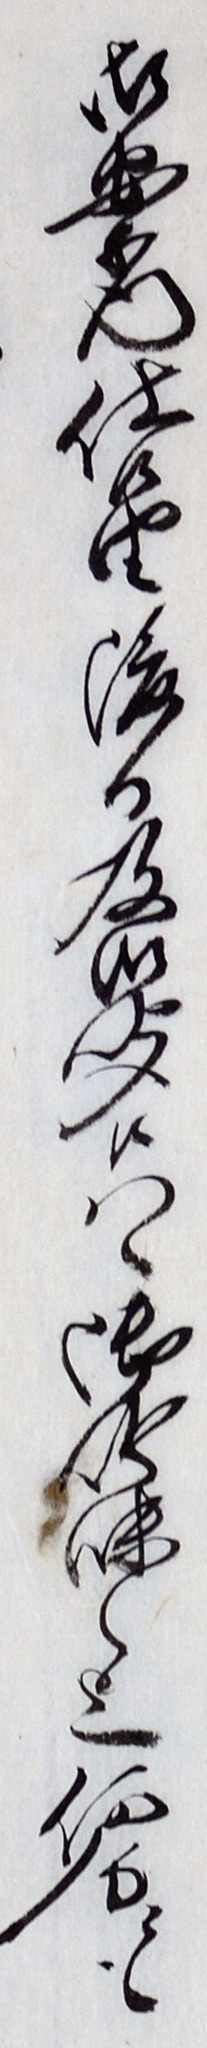御案内仕候由後日及御聞候ハヽ御吟味之上何分ニも
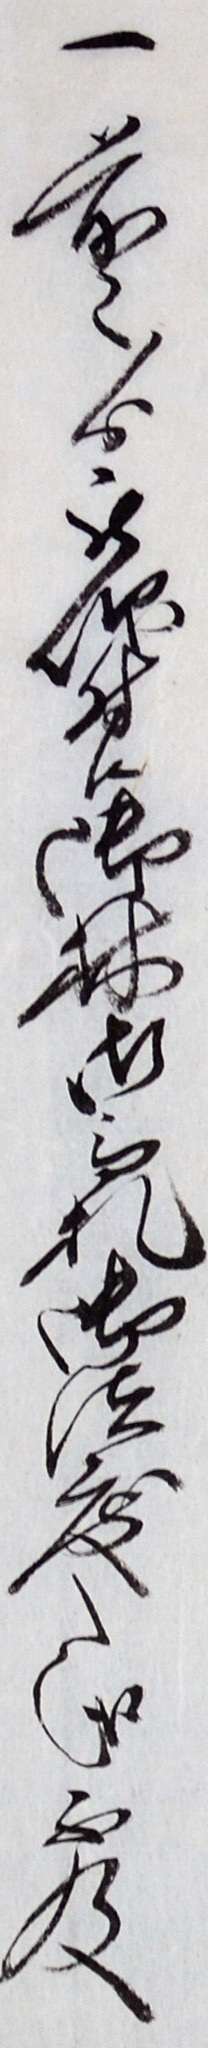一前々ゟ被仰付候御林御高札御法度之趣不及
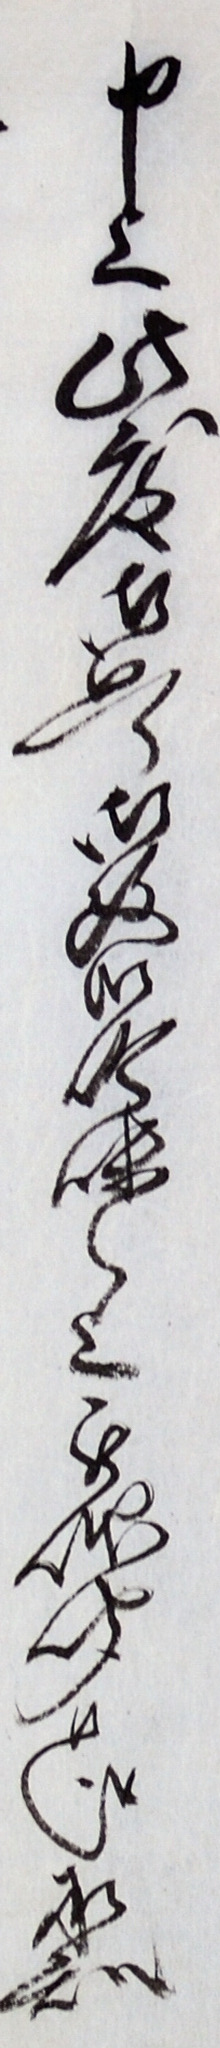申上此度御廻り御改御吟味之上被仰聞候趣承知
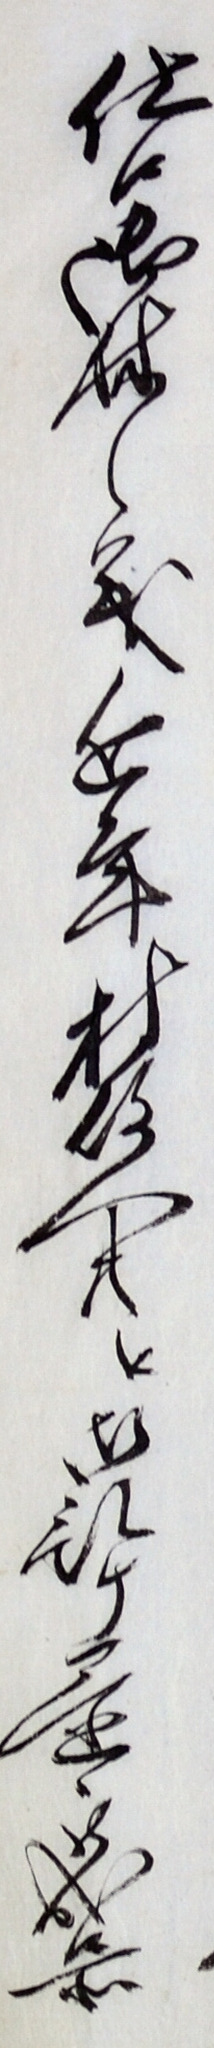仕候御林之義近年村役人共え御預ヶ置被成候所

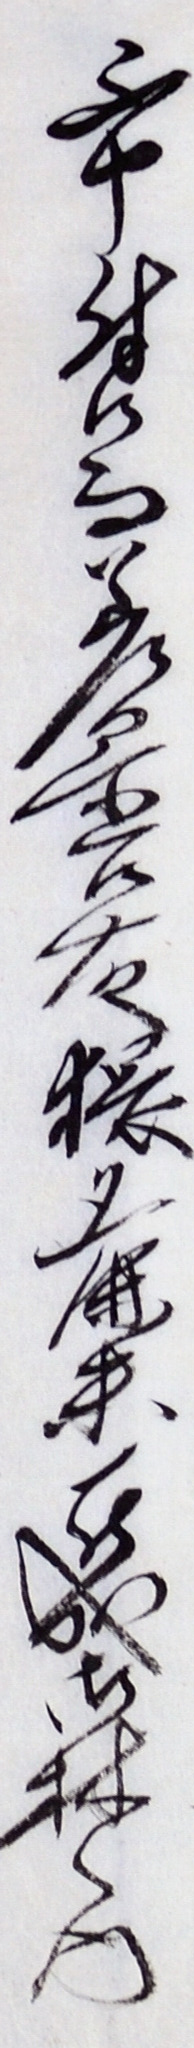不申付候而差置候故猥麁末罷成御林之内
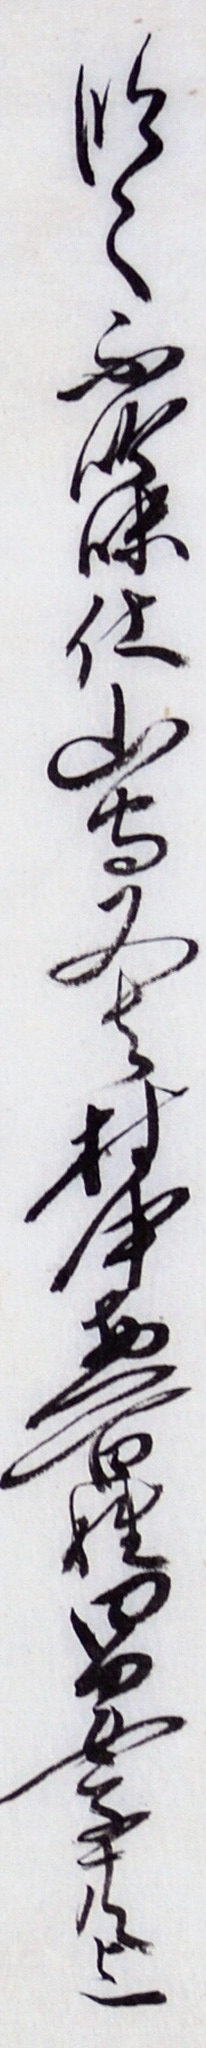段々不吟味仕山守又は村中惣百姓男女子共迄
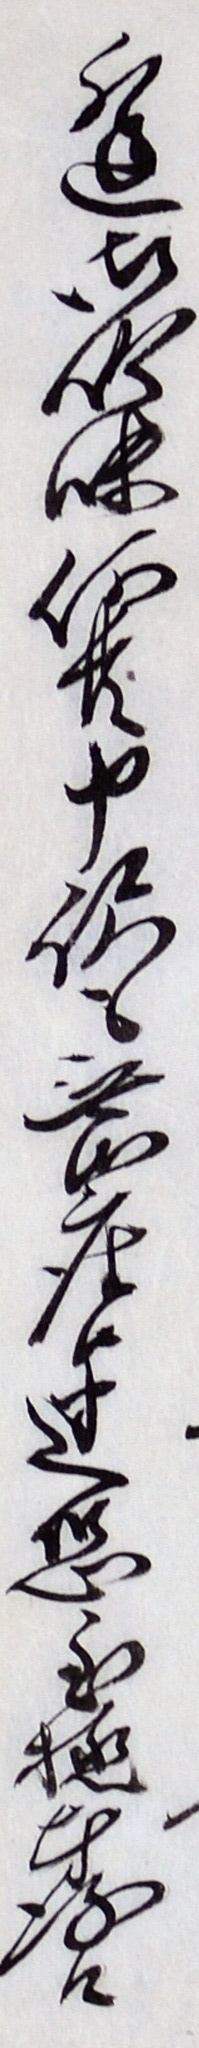逢御吟味何共申訳も無御座候迷惑至極奉存候
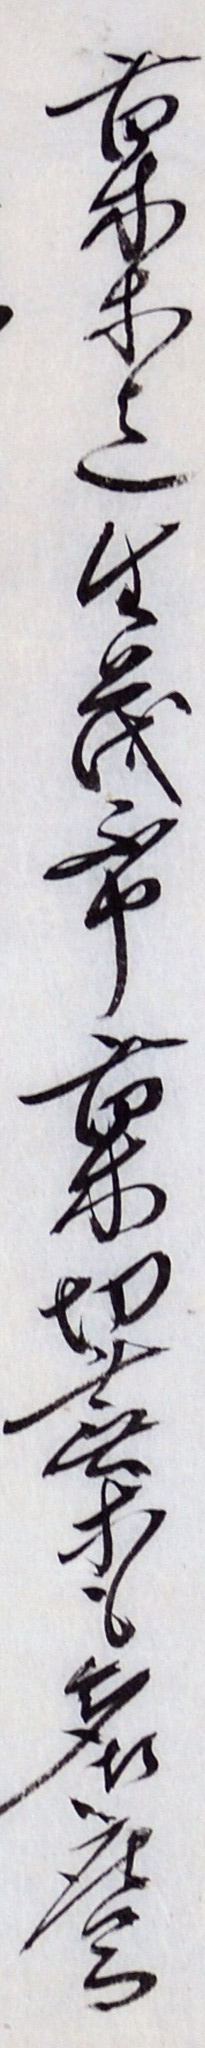苗木等迄生茂不申苗木切蕪等も多御座候而
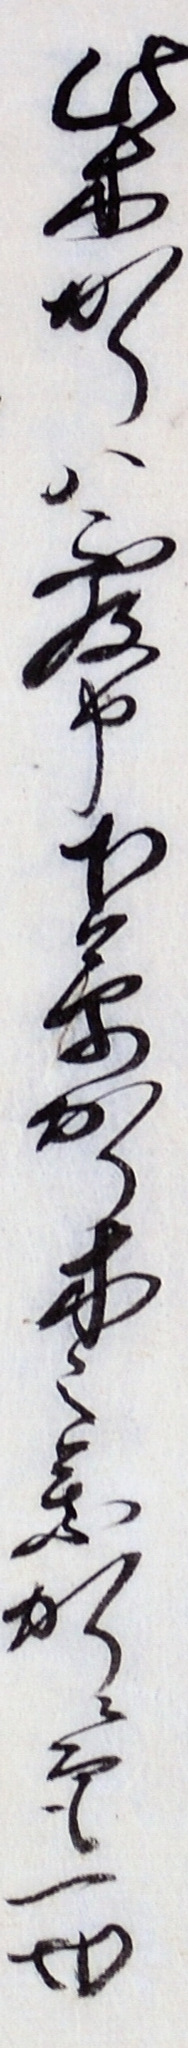柴かりハ不及申下草かり木之葉かりニ而も一切
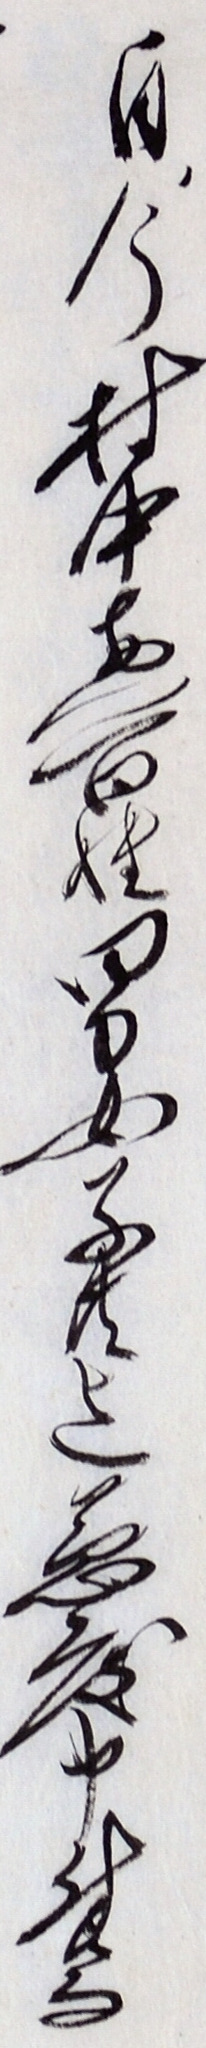自今村中惣百姓男女子共迄急度申付候而
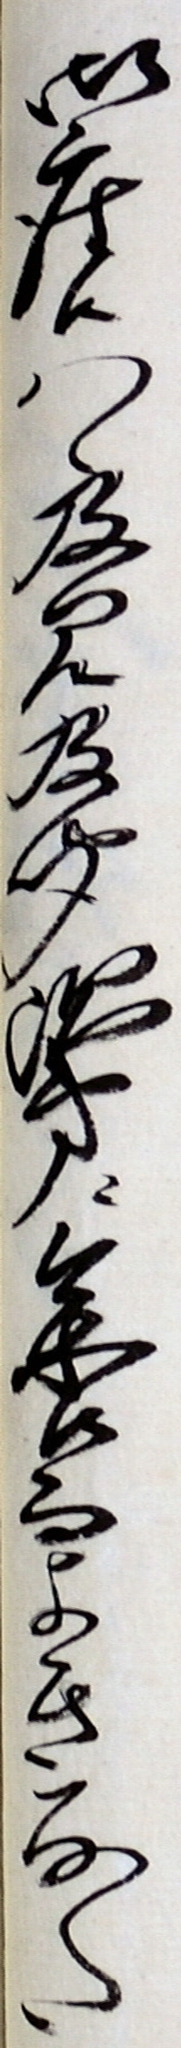御座候ハヽ及見及聞次第ニ参候而よきなた
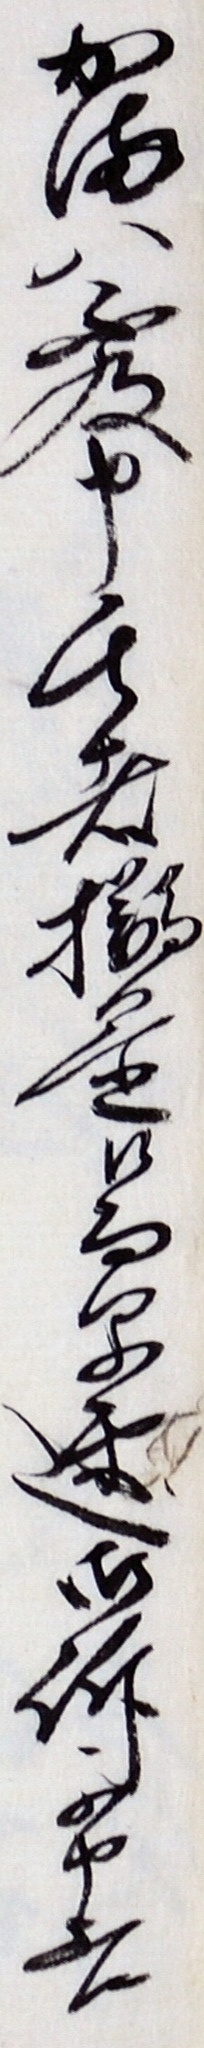かまハ不及申其者搦置候而早速御訴可申上候
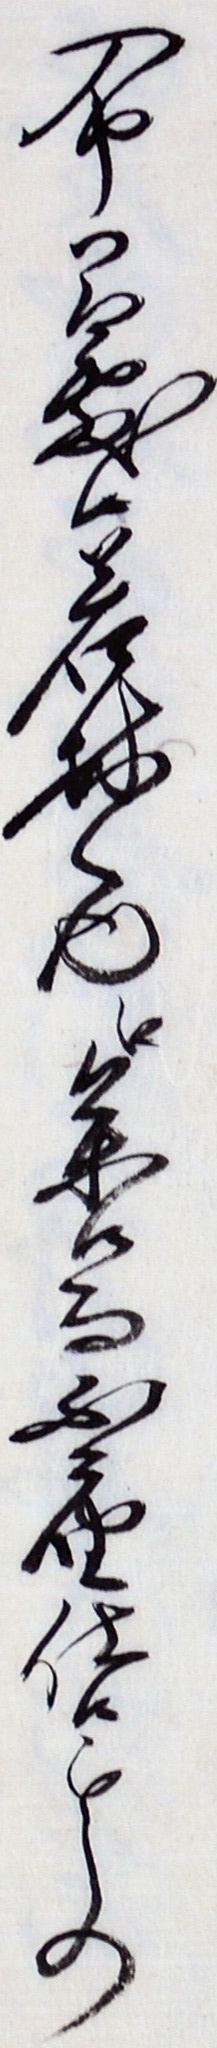入申間敷候若林之内え参候而不届仕候もの
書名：御林御竹藪証文控
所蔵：伊那市立高遠町図書館・合同会社AMANE
